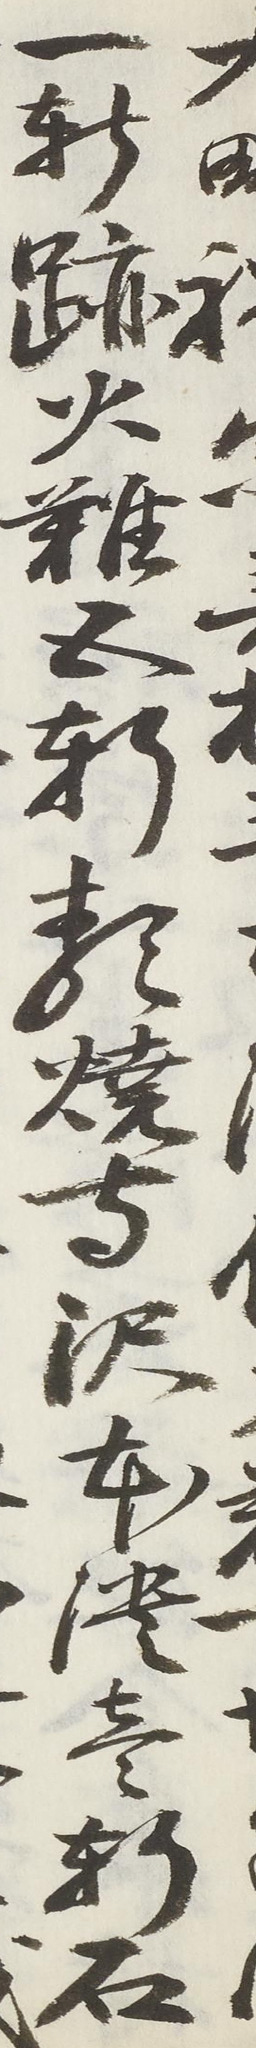一軒跡火難五軒類焼寺沢本潰壱軒石
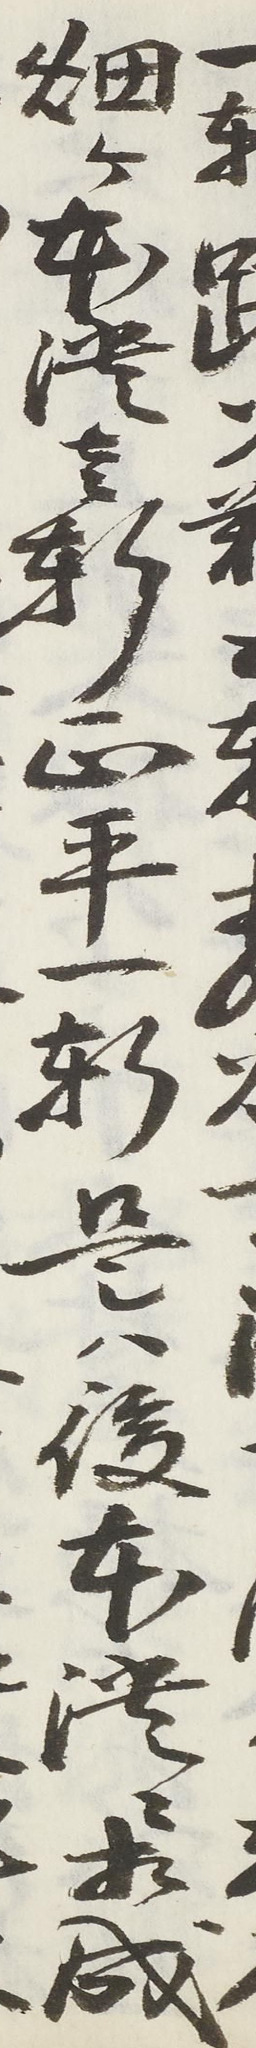畑ヶ本潰壱軒正平一軒是ハ後本潰二相成
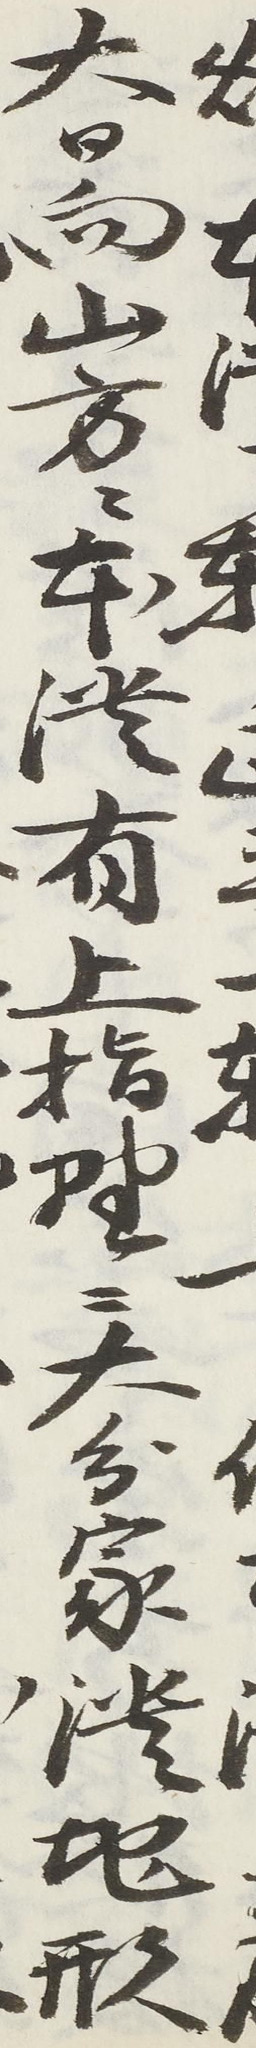大日方二本潰有上指野二大分家潰地形
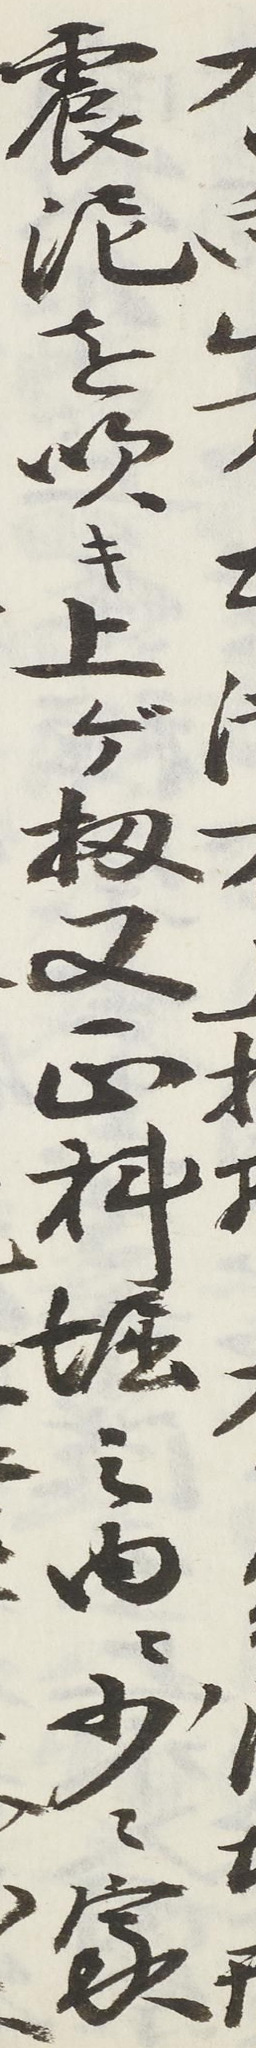震泥を吹キ上ゲ扨又正科堀之内二少々家
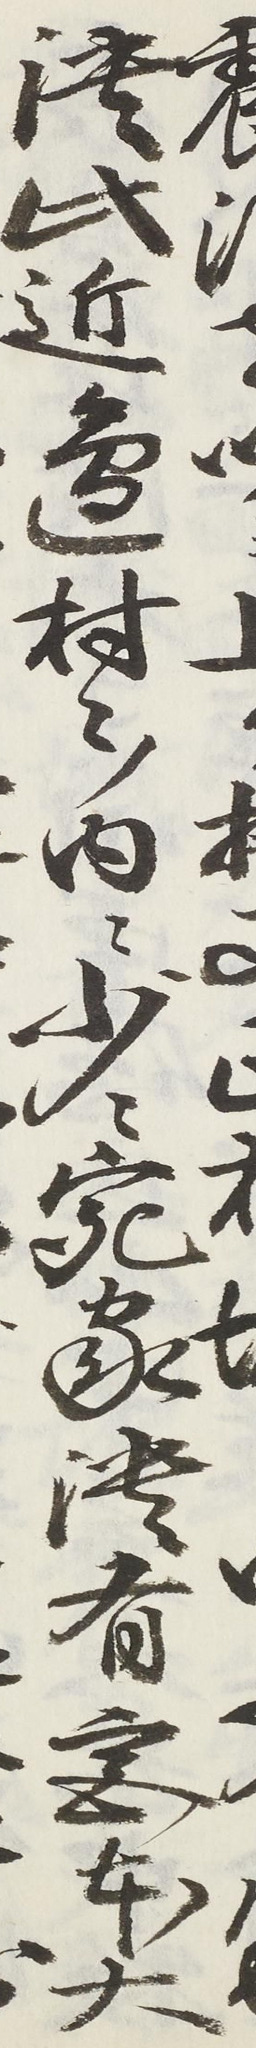潰此近辺村々ノ内二少々宛家潰有宮本大
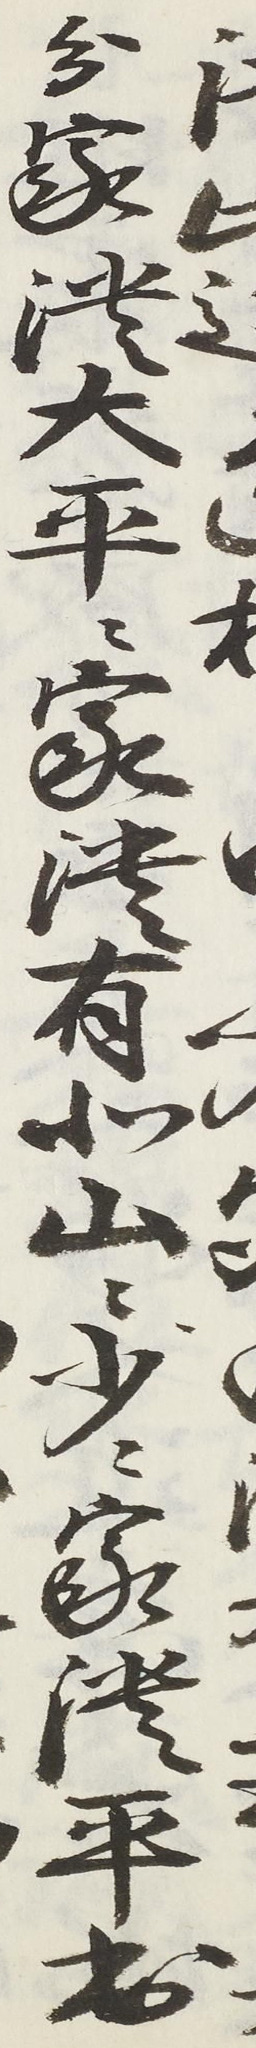分家潰大平二家潰有北山二少々家潰平出
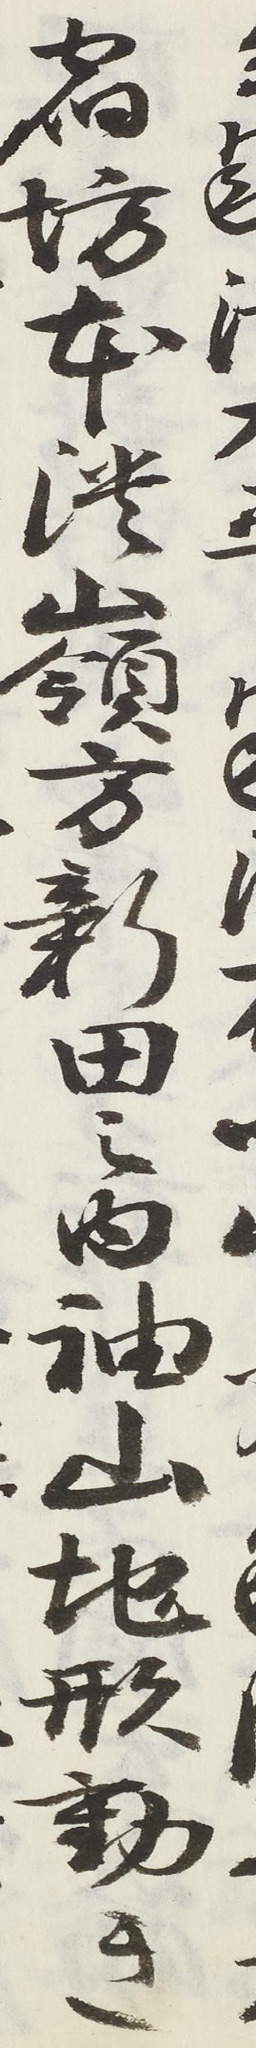宿坊本潰嶺方新田之内袖山地形動き
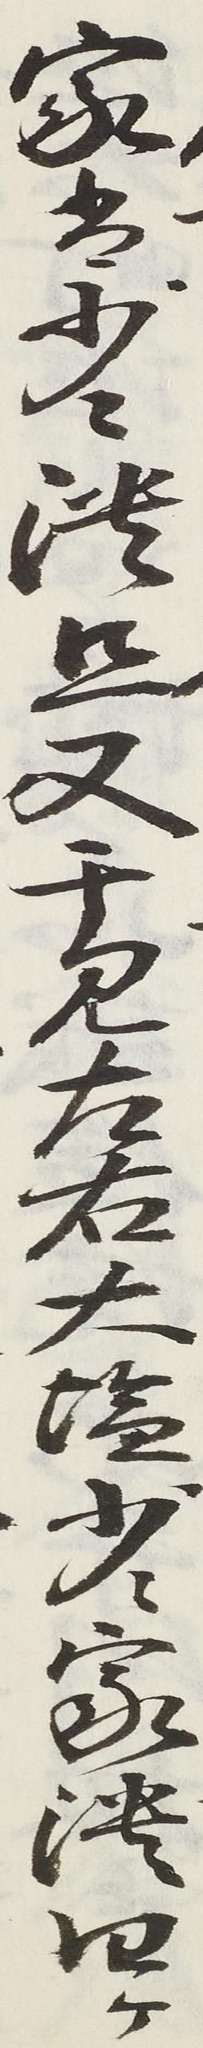家は少々潰且又千見左右大塩少々家潰四ヶ
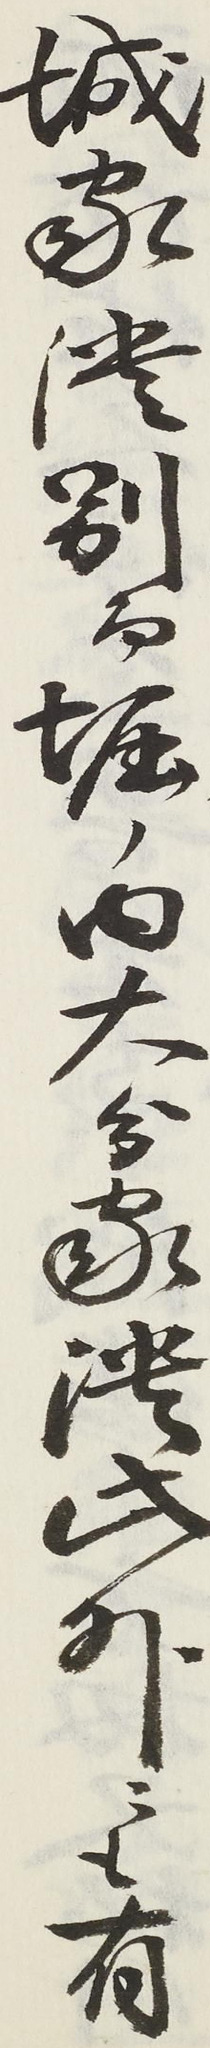城家潰別而堀ノ内大分家潰此外二も有
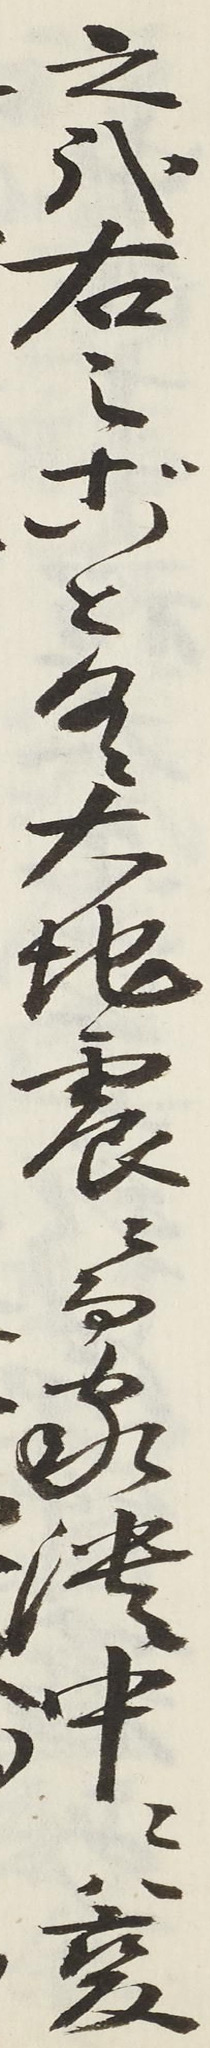之哉右之ごとく大地震二而家潰中二ハ変
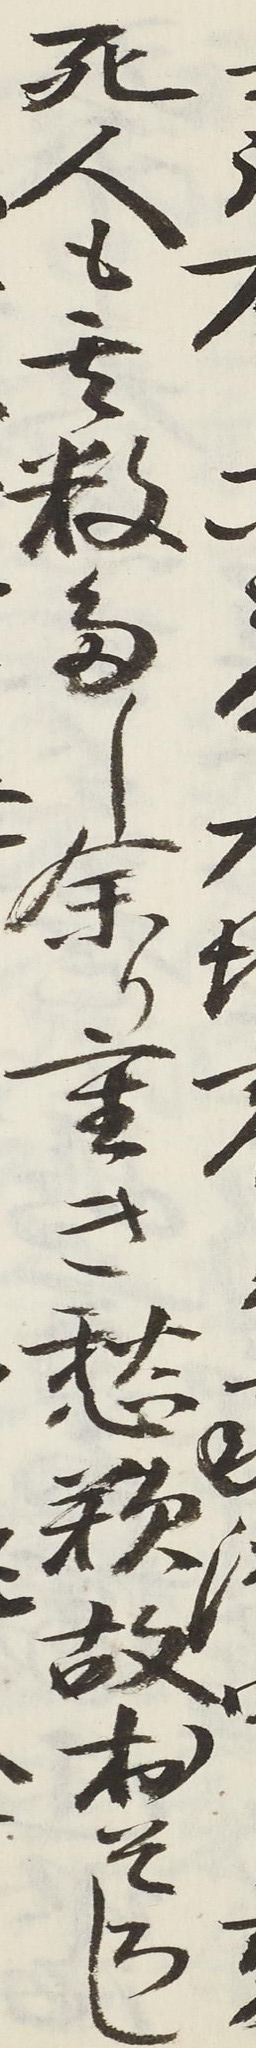死人も其数多し余り重き愁歎故おそろし
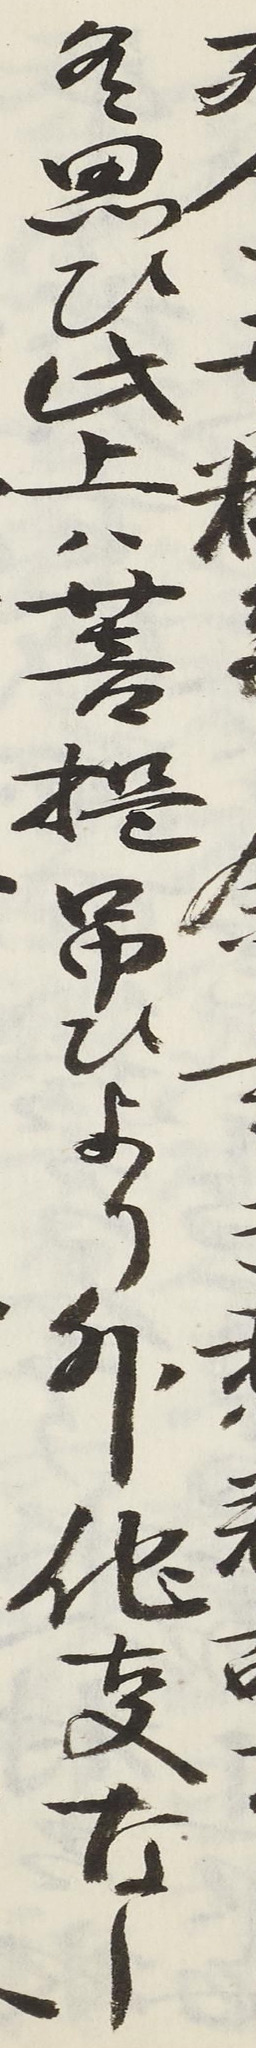く思ひ此上ハ菩提吊ひより外他事なし
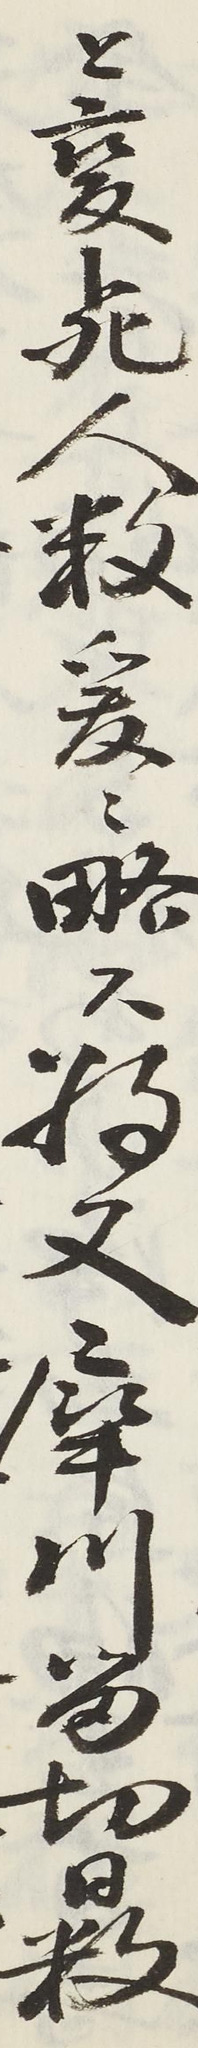と変死人数爰二略ㇲ将又犀川留切日数
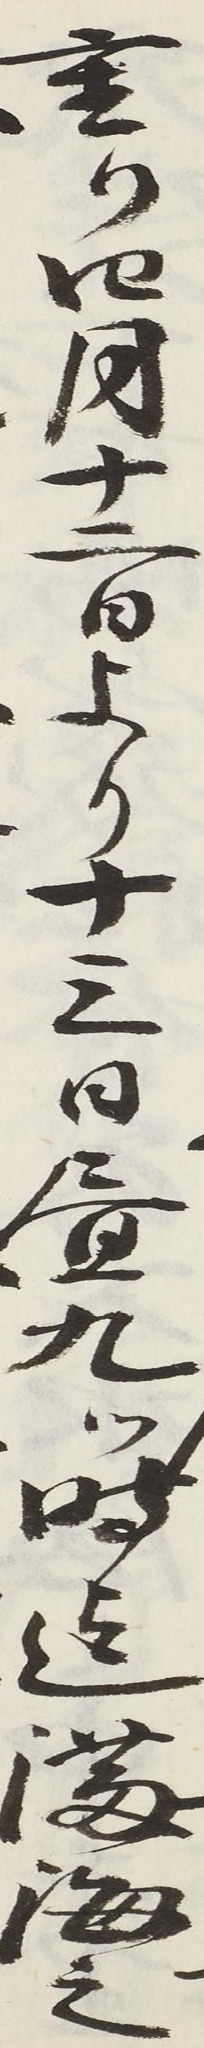重り四月十二日より十三日昼九ッ時迄満海之
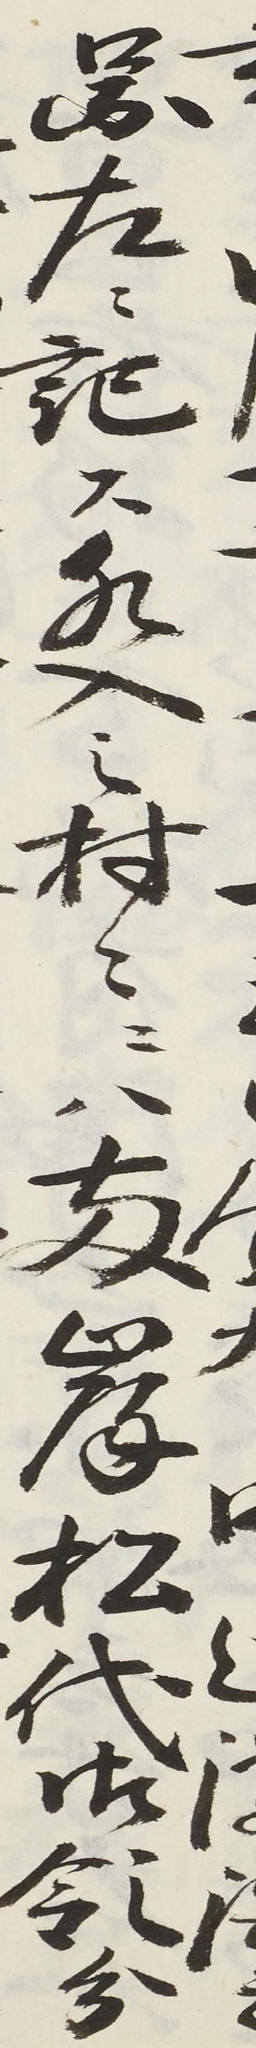図左二記ㇲ水入之村々二ハ両岸松代御領分
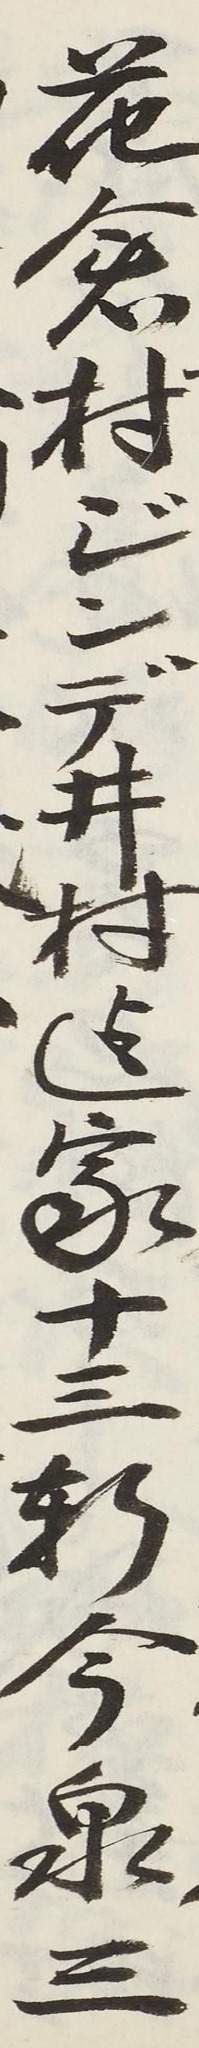花倉村ジンデ井村迄家十三軒今泉三
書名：弘化四年地震記
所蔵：東京大学地震研究所図書室 Earthquake Research Institute Library, The University of Tokyo, JAPAN
